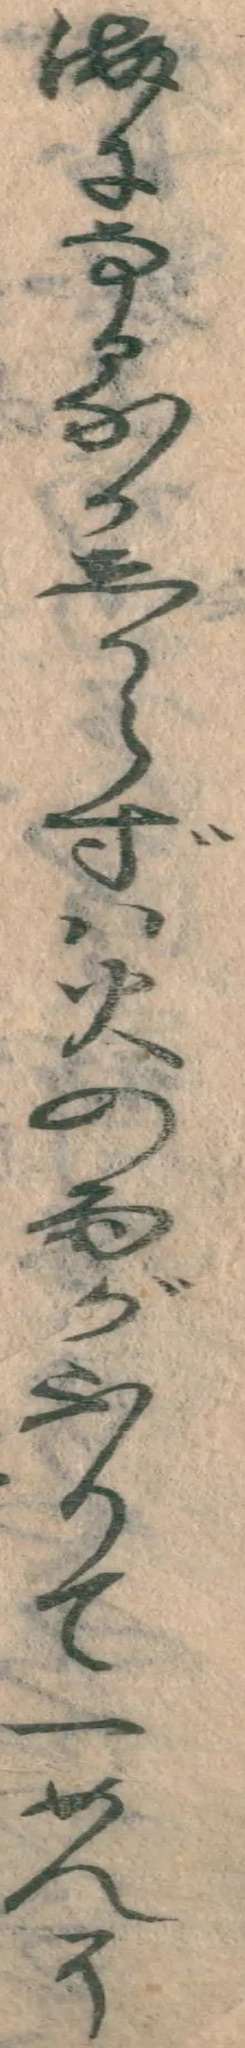海になるかしからずは火の雨がふりて一めんに
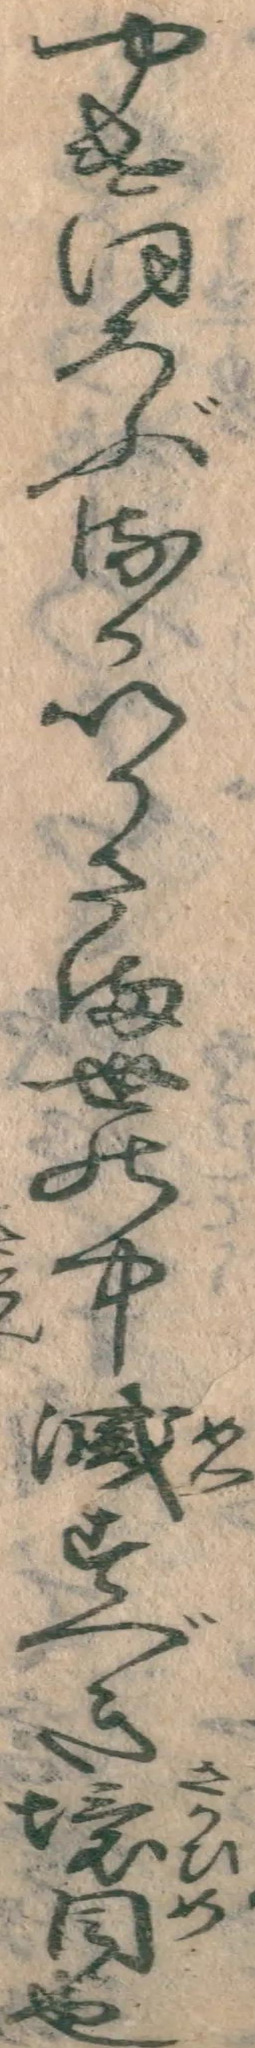やけほろぶるかいかさま世の中滅すべき境目也
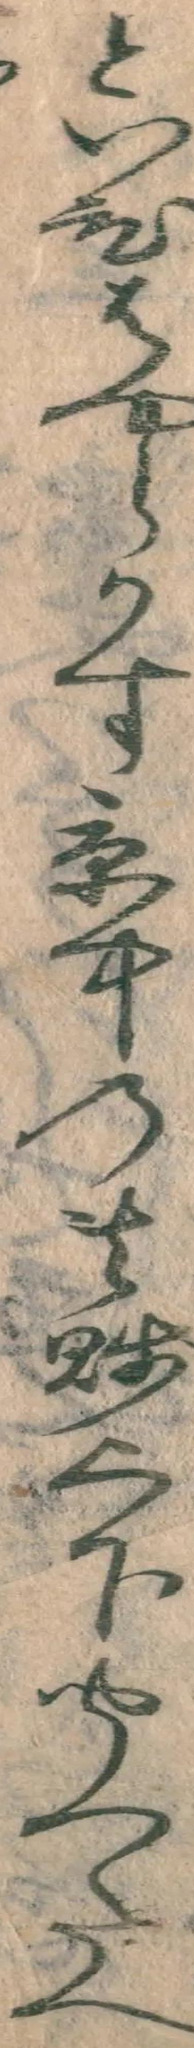といひはやらかす京中の貴賤上下聞つたへ
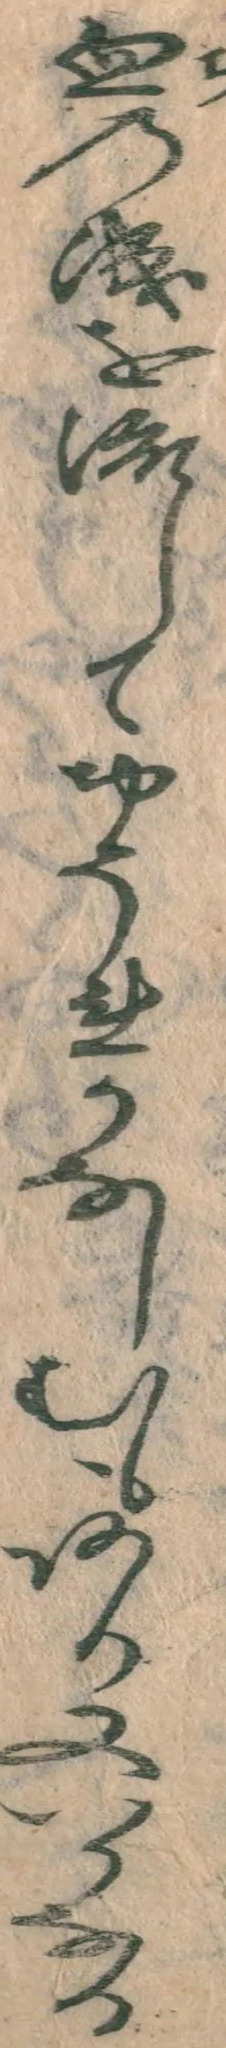血の洟を流しておそれかなしむもあり又いかなる
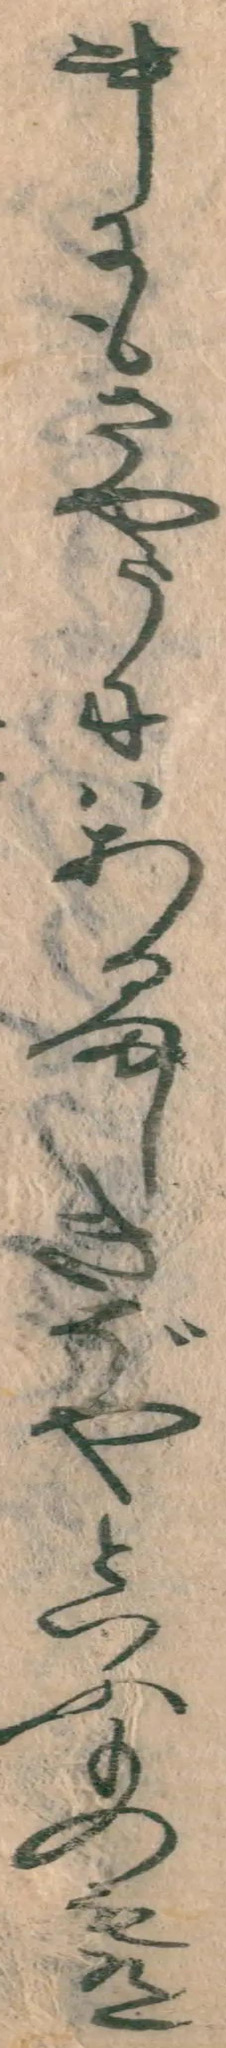事にもさやうにはあるましきぞやといふものも有
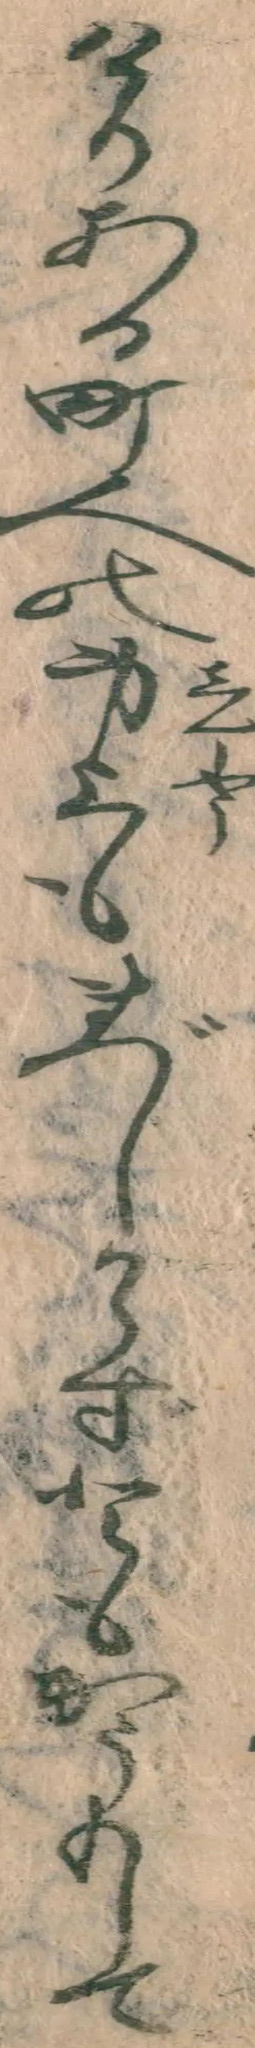けりある町人の身上もまづしからずともかうもして
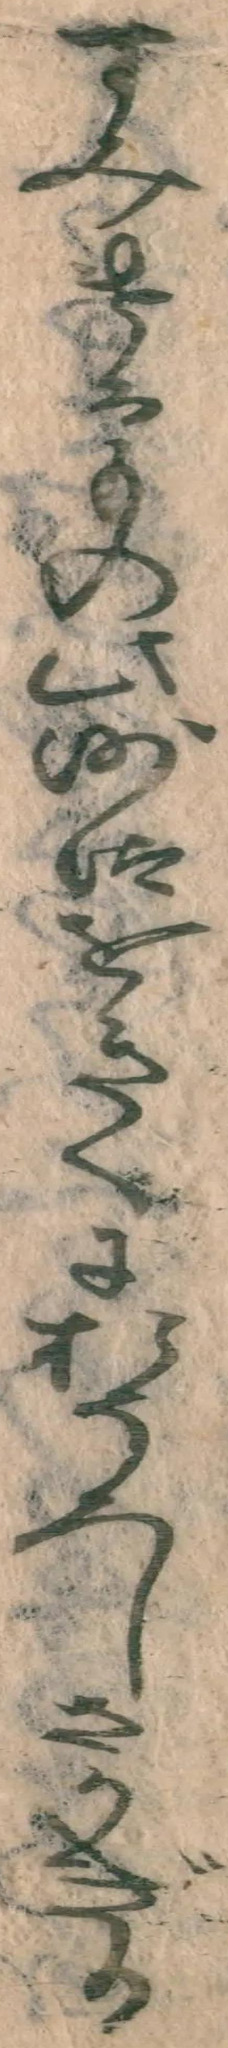すみけるもの此沙汰をきくにおそろしさかぎり
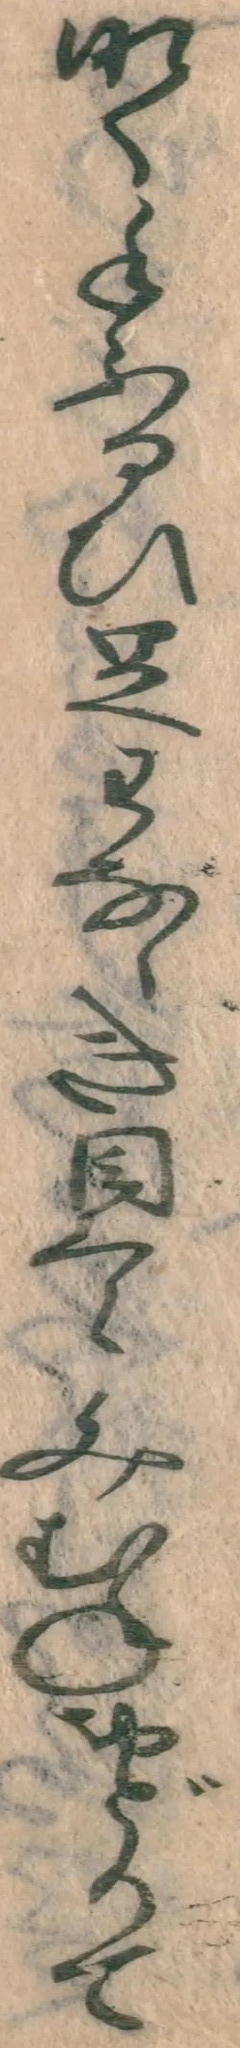なく手ふるひ足わなゝき目くらみむねおどりて
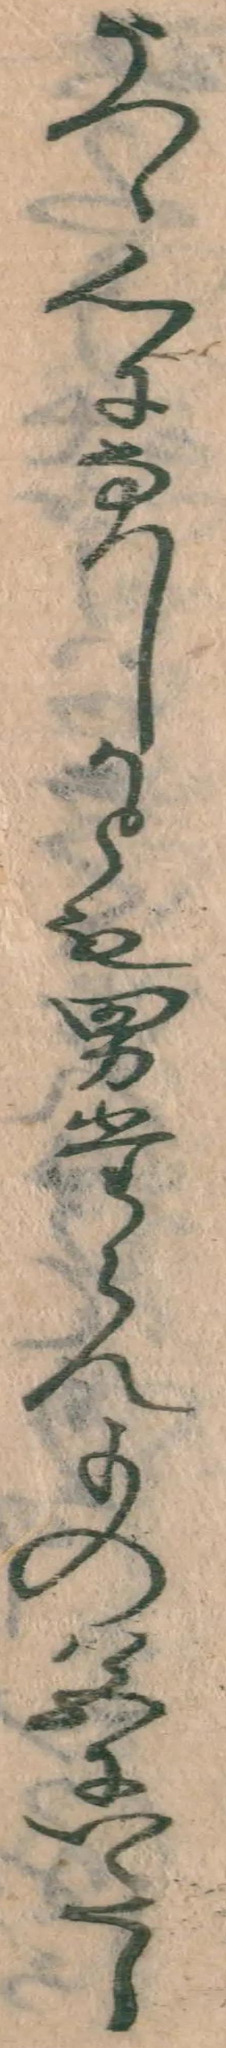うつゝ心になりしかとも男たらんもの色にいたし
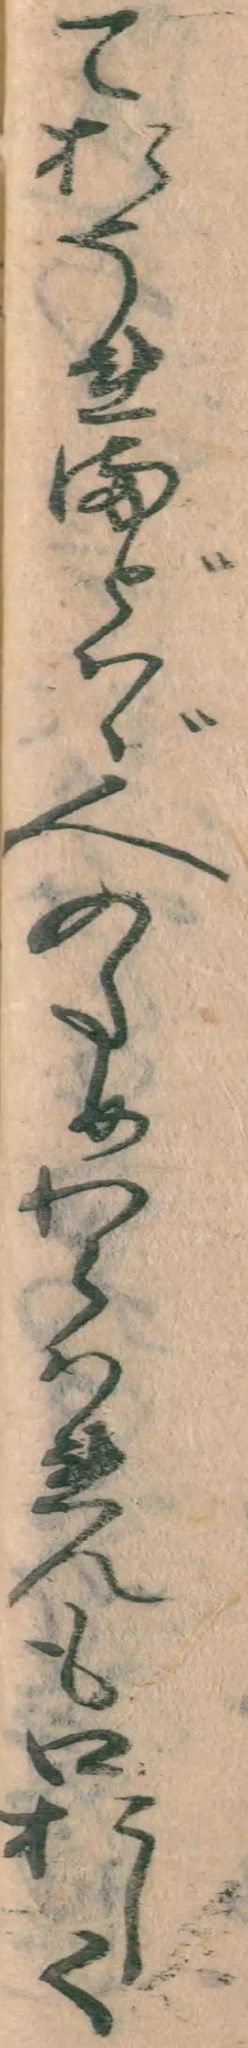ておそれまどはゞ人のためわらはれんも口おしく
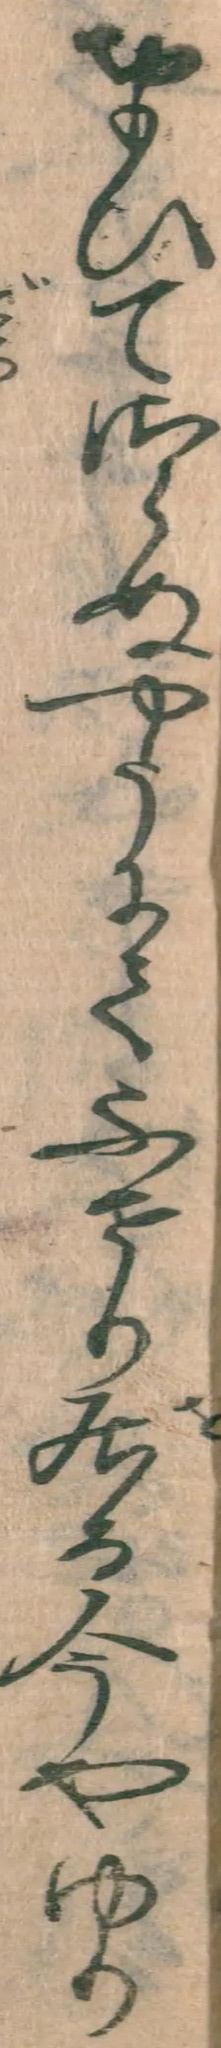おもいてさらぬやうにてふけり居る今やゆり
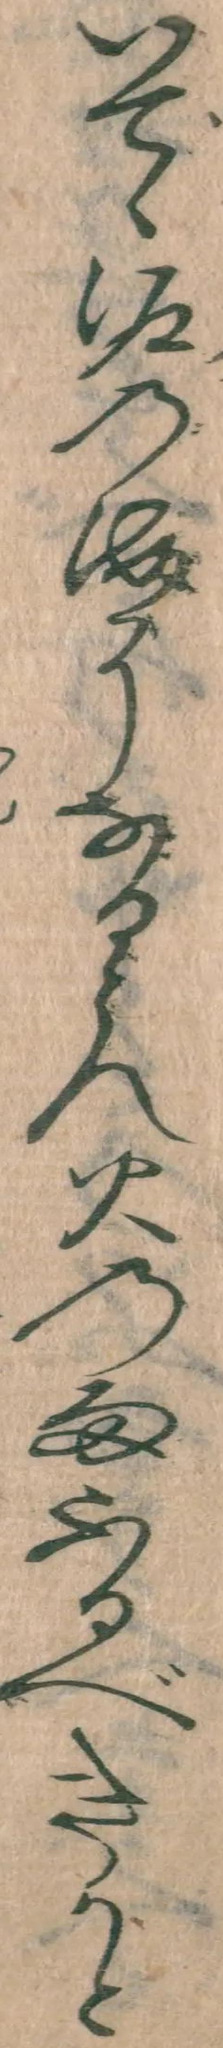いでて泥の海になるらん火の雨ふるべきかと
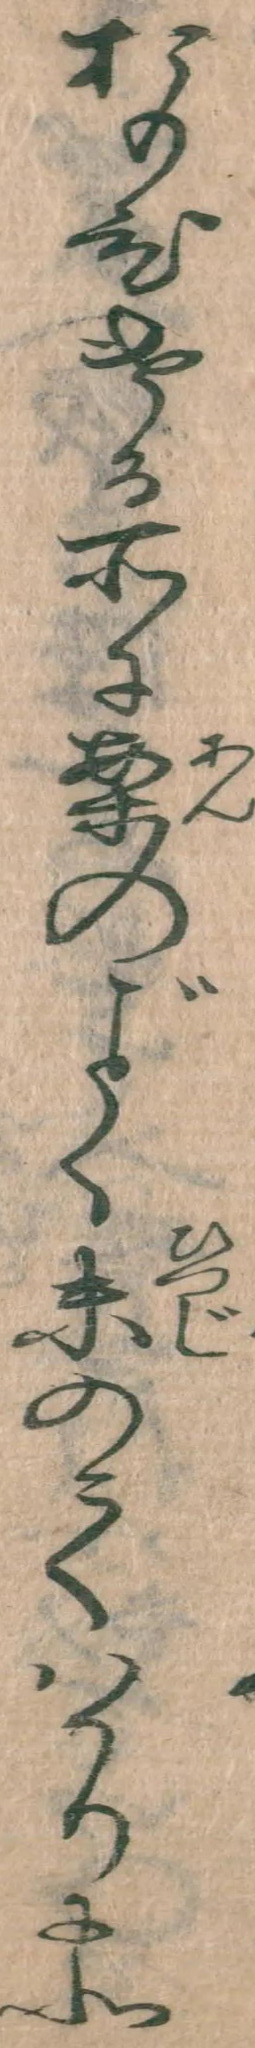おもひける所に案のごとく未のこくはかりに北
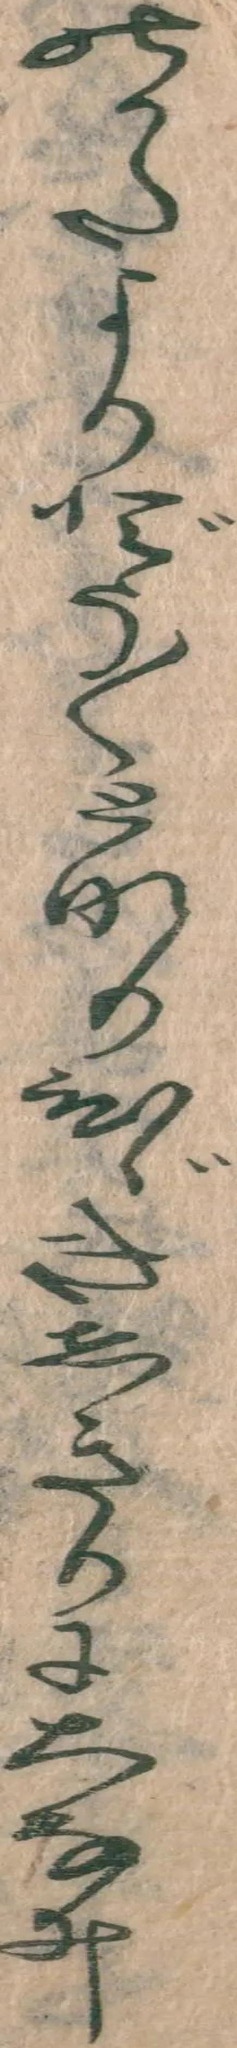のかたよりどう〳〵となりひゞきしきりに大なゐ
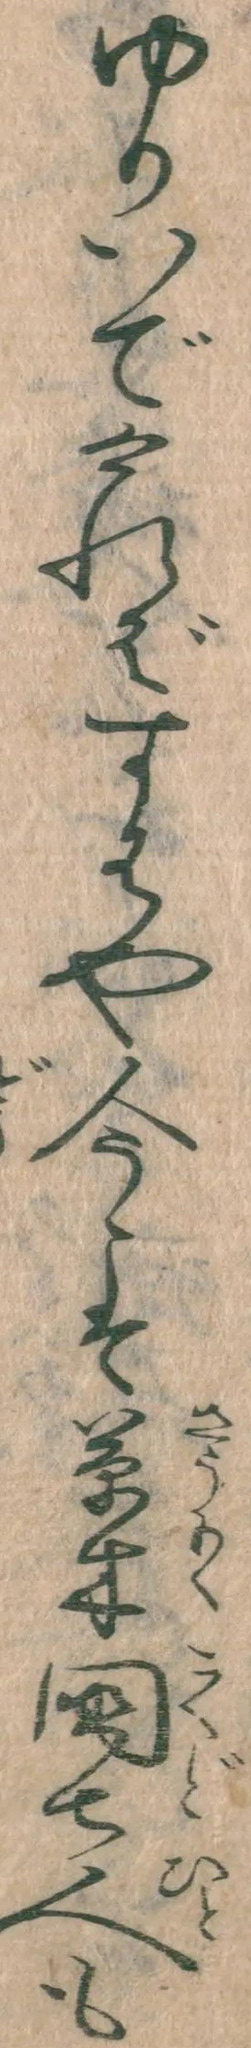ゆりいでければすはや今こそ草木国土人も
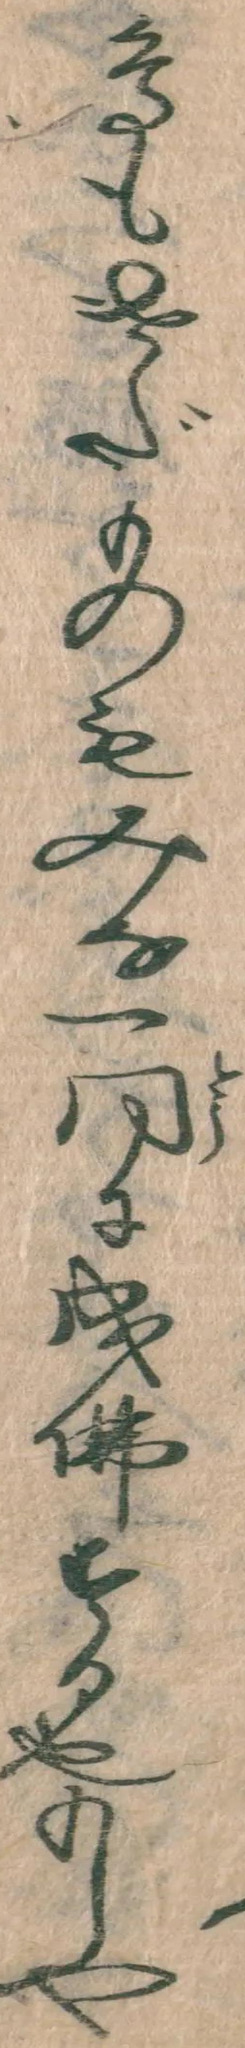鳥もけだものもみな一同に成佛する也もしや
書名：艱難目異志. 上,下
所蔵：国立国会図書館 National Diet Library, JAPAN
